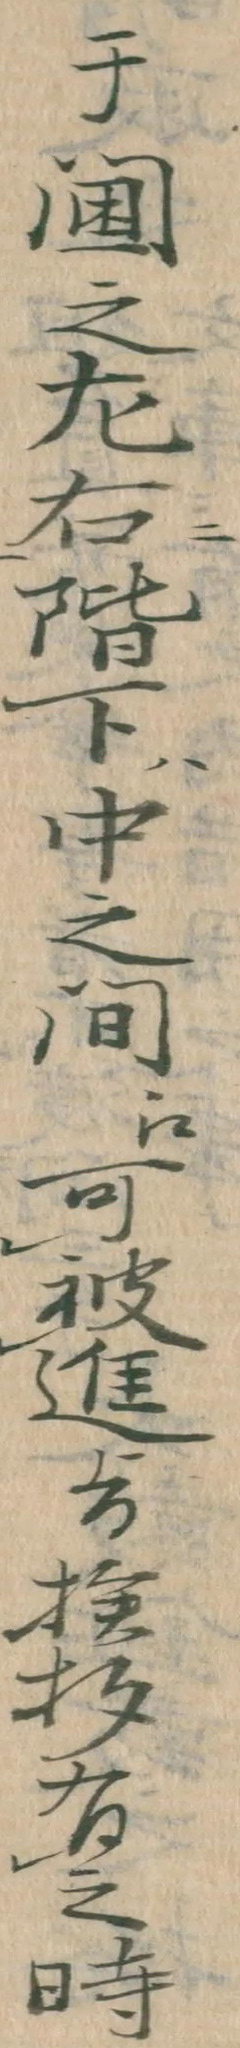于閫之左右階下中之間江可被進旨挨拶有之時
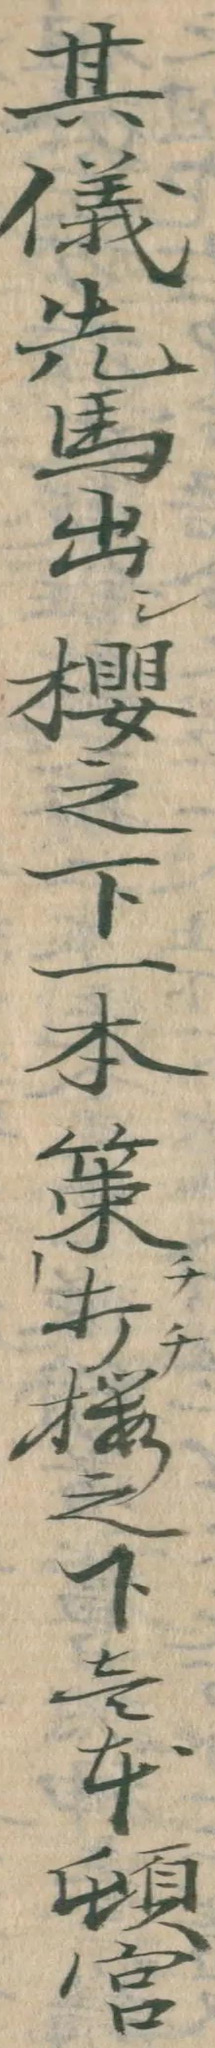其儀先馬出桜之下一本䇿-打櫻之下壱本頓宮

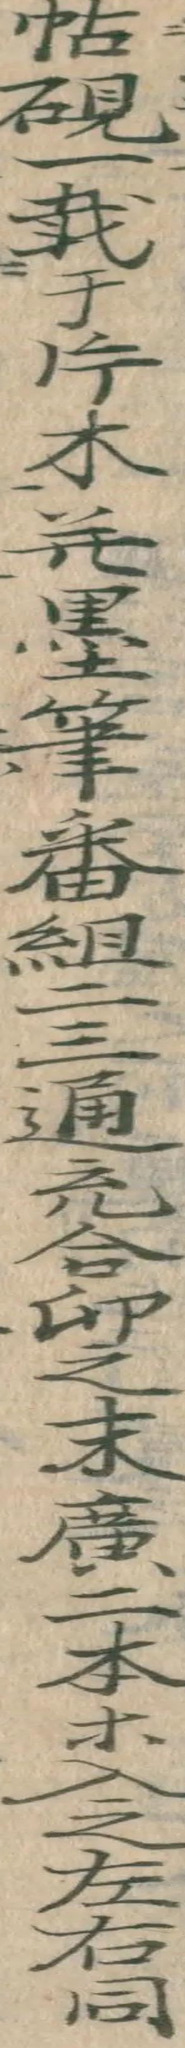一帖硯一載于片木并墨筆番組二三通充合印之末広二本等入之左右同
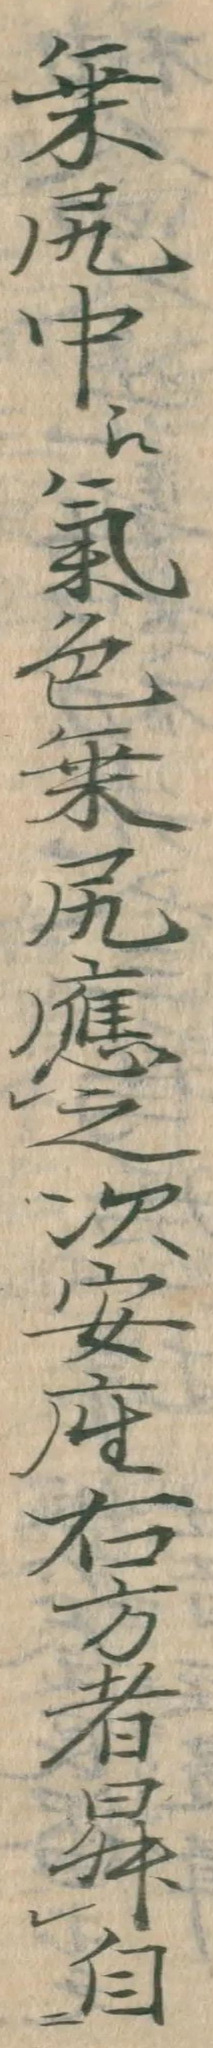乗尻中江気色乗尻応之次安座右方者昇自
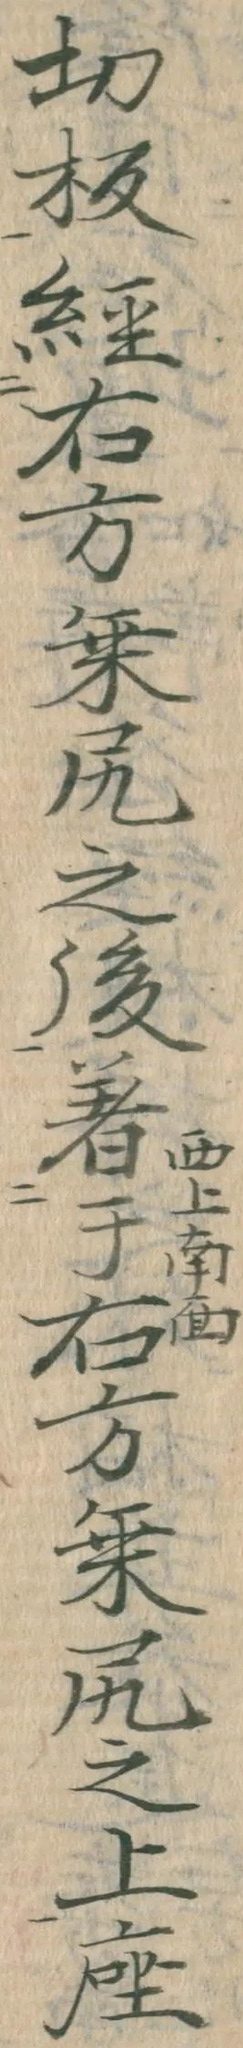切板経右方乗尻之後着于右方乗尻之上座

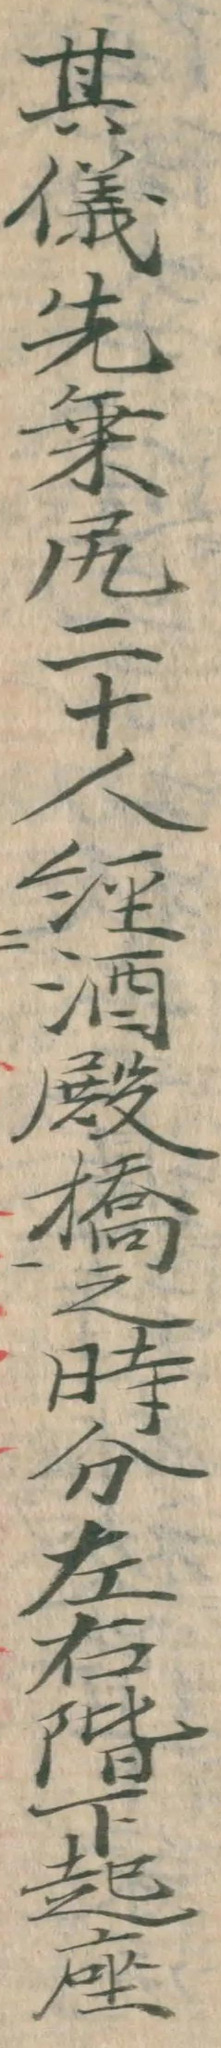其儀先乗尻二十人経酒殿橋之時分左右階下起座
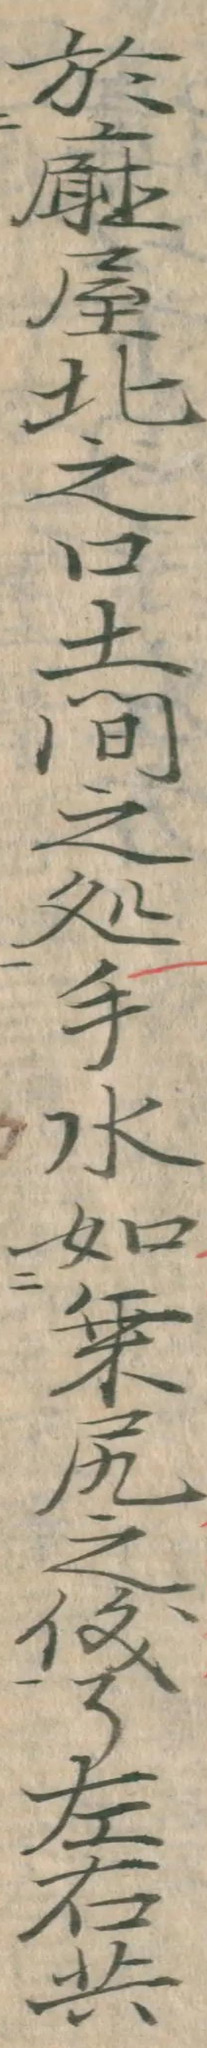於庁屋北之口土間之処手水如乗尻之儀了左右共
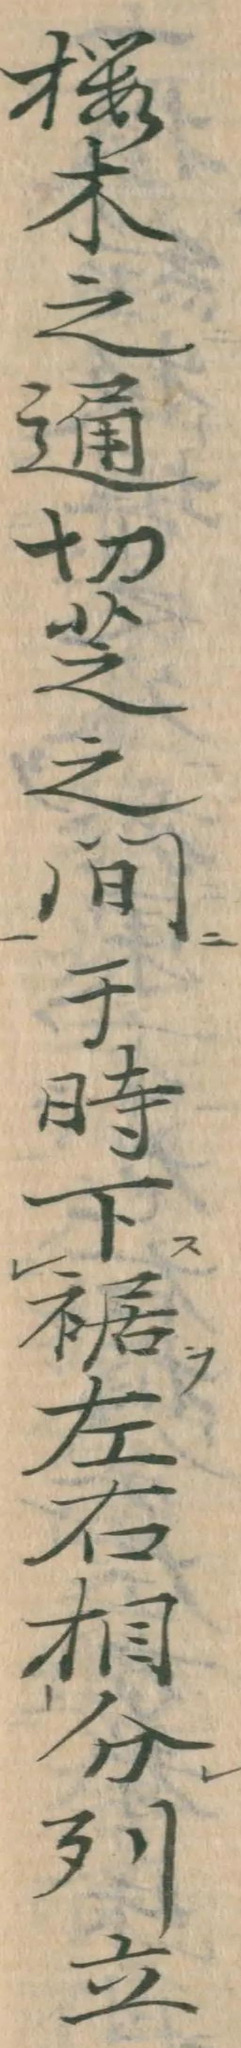桜木之通切芝之間于時下裾左右相-分列立
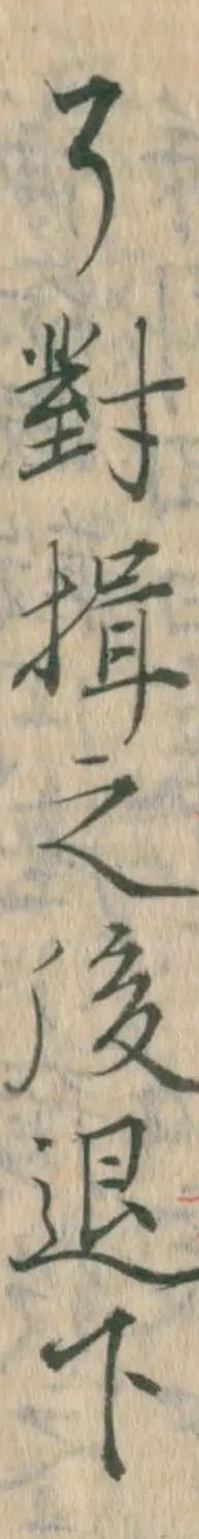了対揖之後退下

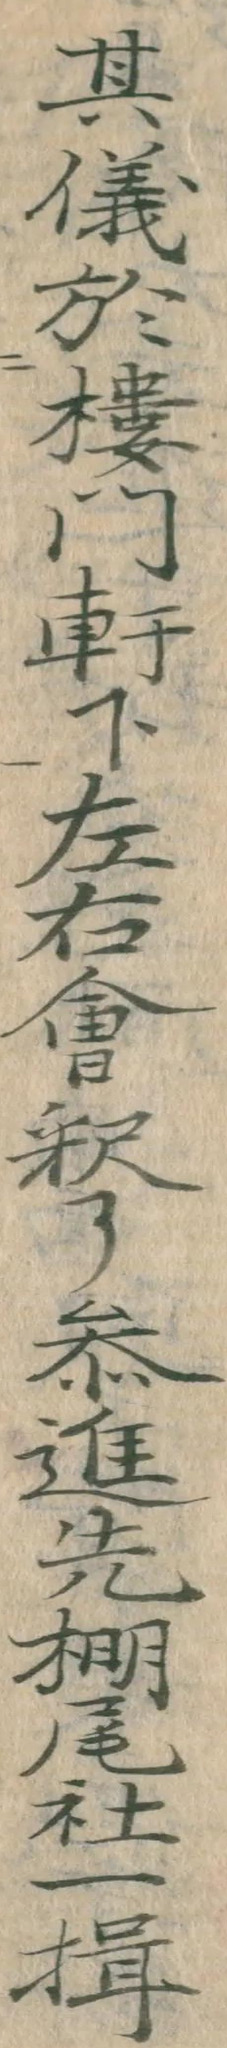其儀於楼門軒下左右会釈了参進先棚尾社一揖
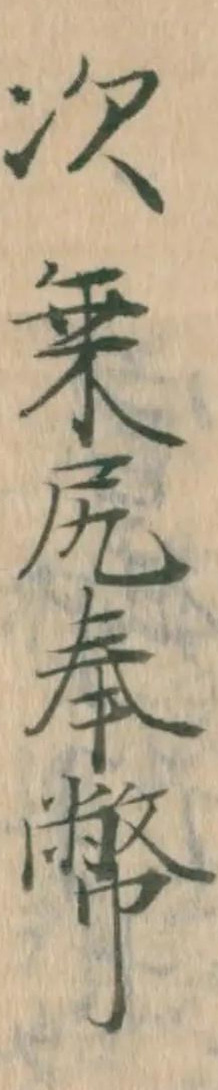次乗尻奉幣
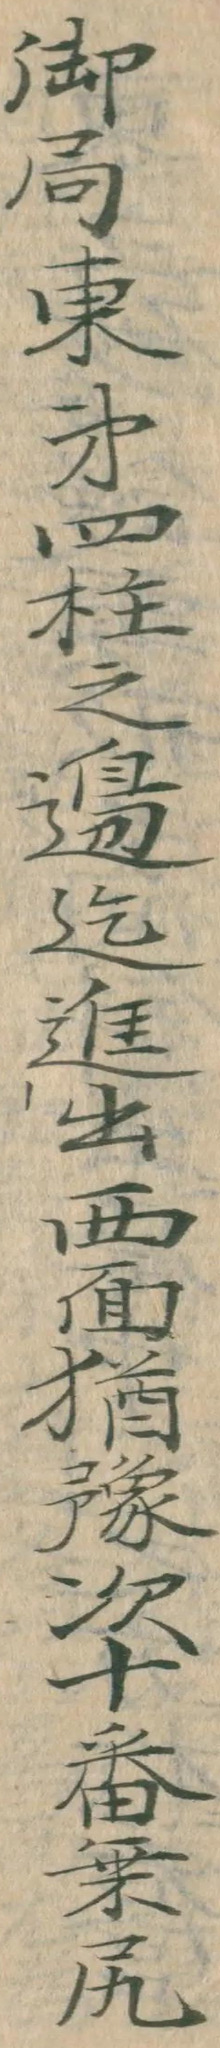御局東第四柱之辺迄進-出西面猶予次十番乗尻

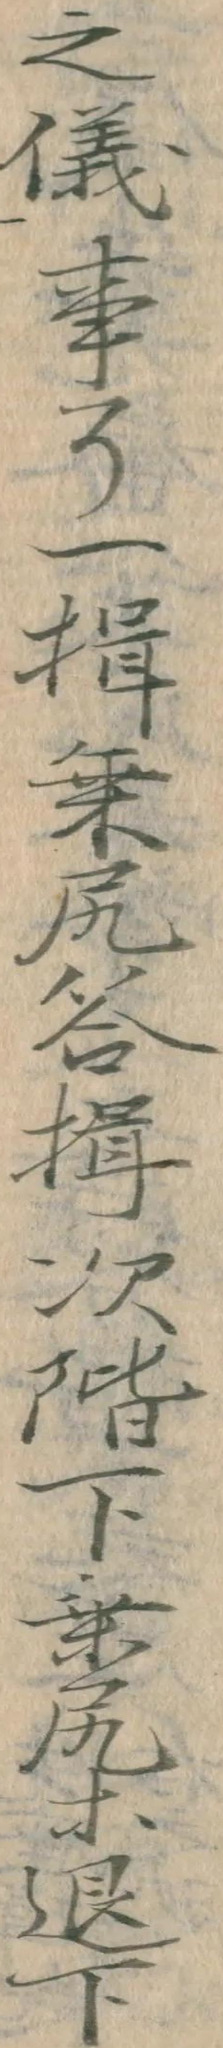之儀事了一揖乗尻答揖次階下乗尻等退下

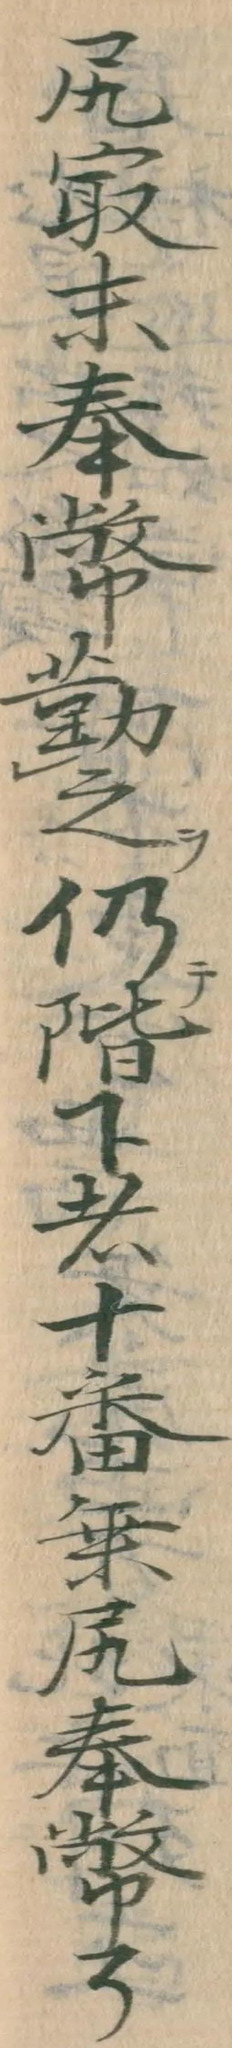尻最末奉幣勤之仍階下者十番乗尻奉幣了

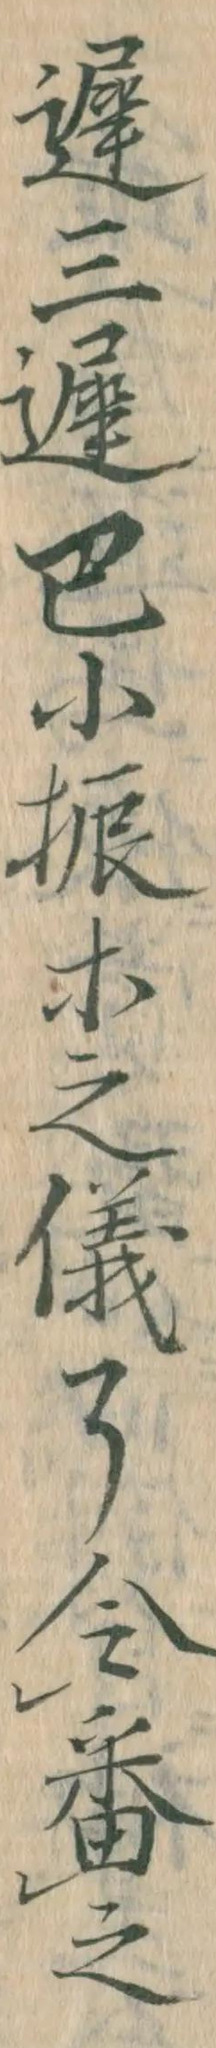遅三遅巴小振等之儀了令番之
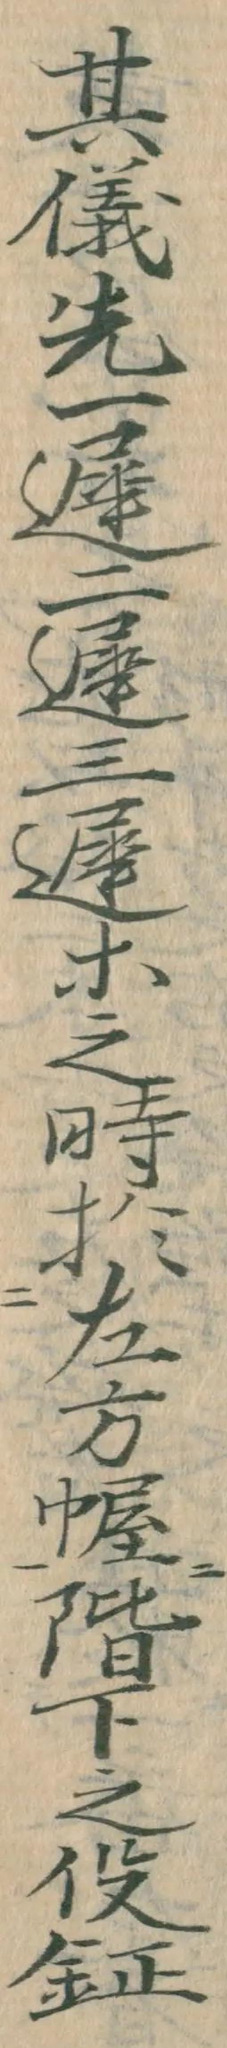其儀先一遅二遅三遅等之時於左方幄階下之役鉦
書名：賀茂社記録. 第8冊
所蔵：国立国会図書館 National Diet Library, JAPAN
